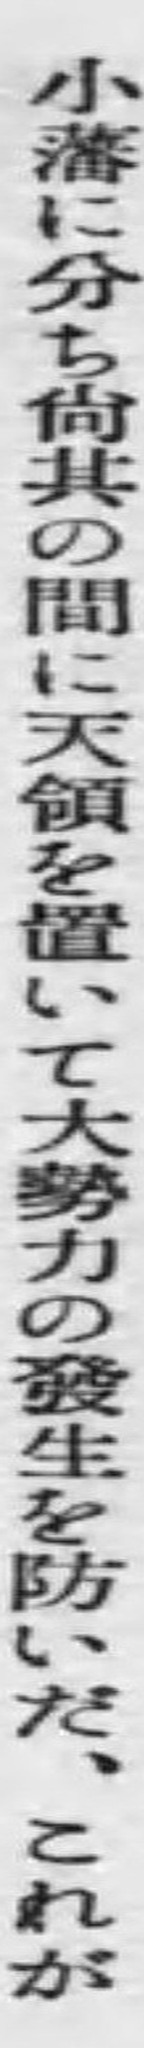小藩に分ち尚其の間に天領を置いて大勢力の発生を防いだ、これが
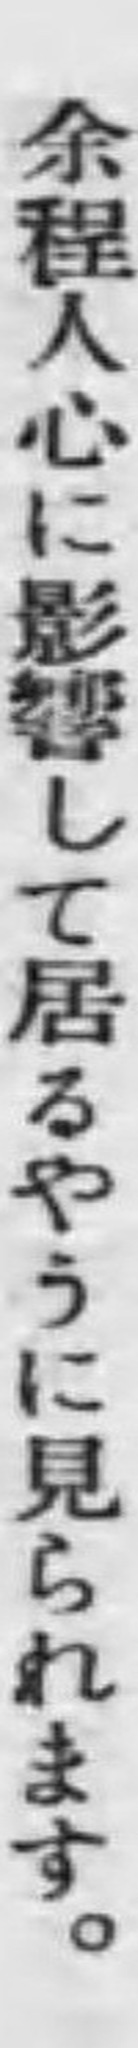余程人心に影響して居るやうに見られます。
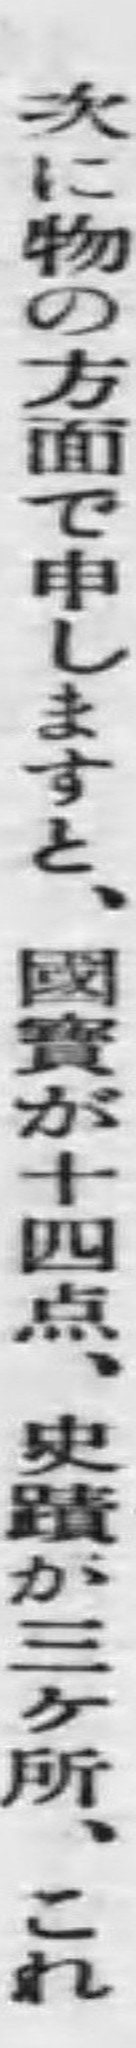次に物の方面で申しますと、国宝が十四点、史蹟が三ヶ所、これ
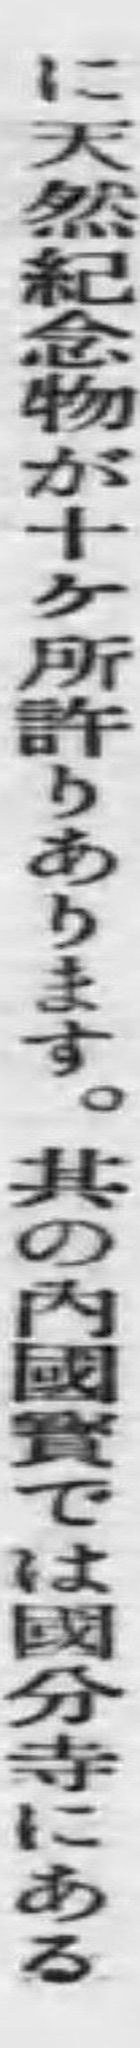に天然紀念物が十ヶ所許りあります。其の内国宝では国分寺にある
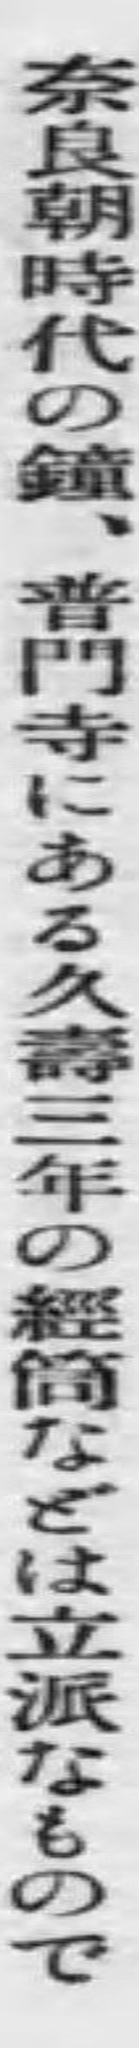奈良朝時代の鐘、普門寺にある久寿三年の経筒などは立派なもので
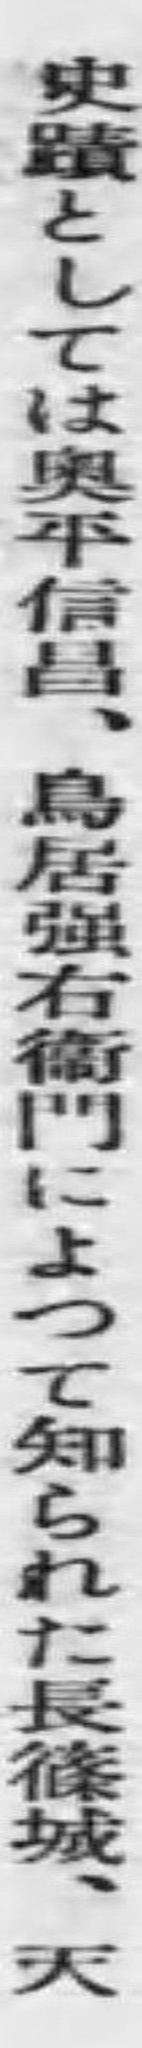史蹟としては奥平信昌、鳥居強右衛門によつて知られた長篠城、天
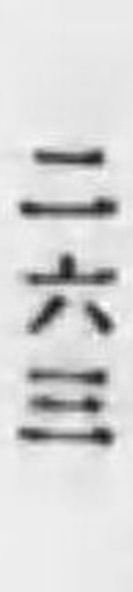二六三

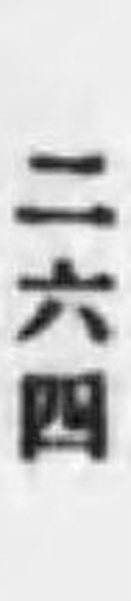二六四
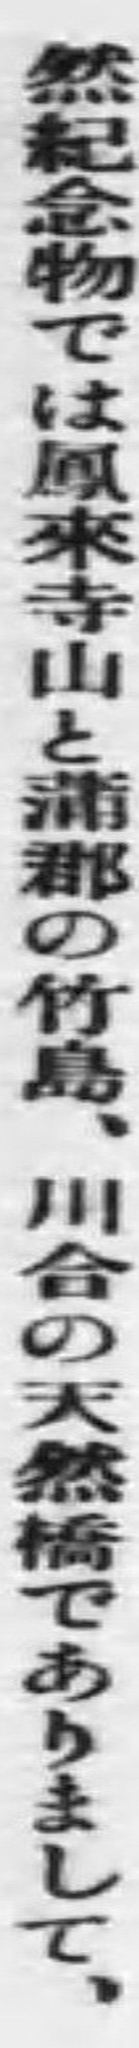然紀念物では鳳来寺山と蒲郡の竹島、川合の天然橋でありまして、
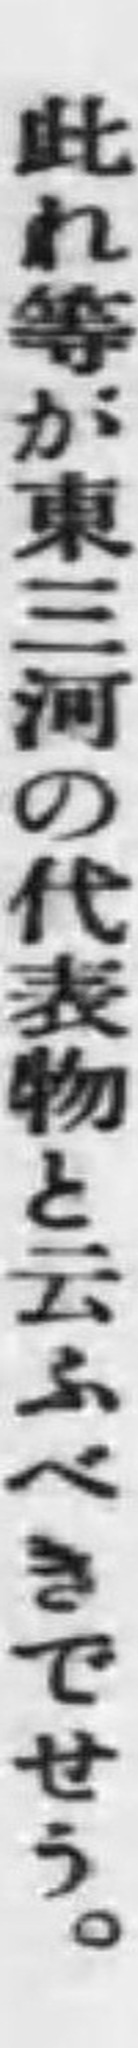此れ等が東三河の代表物と云ふべきでせう。
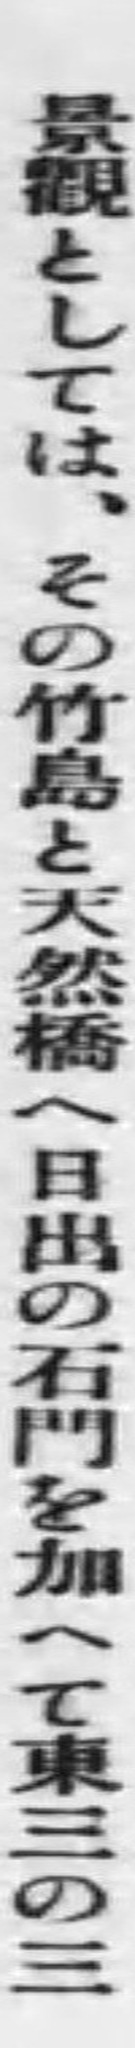景観としては、その竹島と天然橋へ日出の石門を加へて東三の三
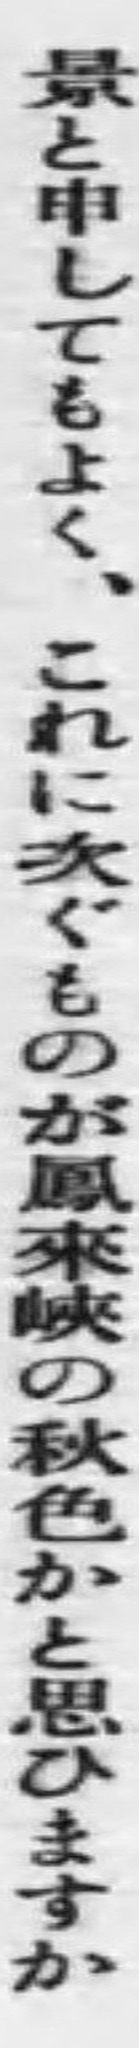景と申してもよく、これに次ぐものが鳳来峡の秋色かと思ひますか
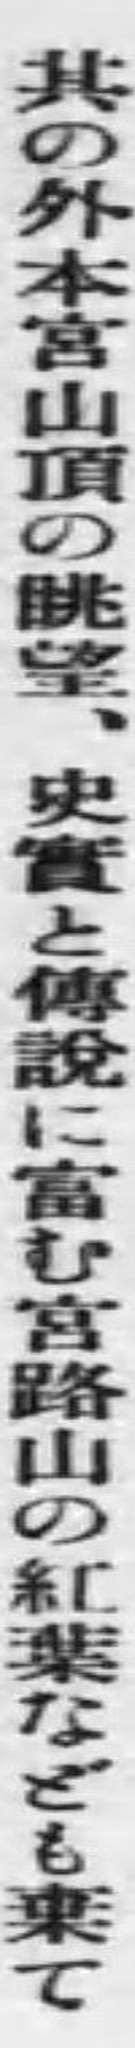其の外本宮山頂の眺望、史実と伝説に富む宮路山の紅葉なども棄て
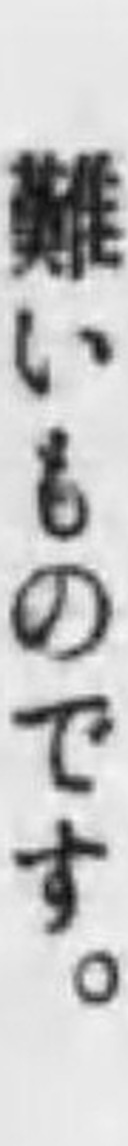難いものです。
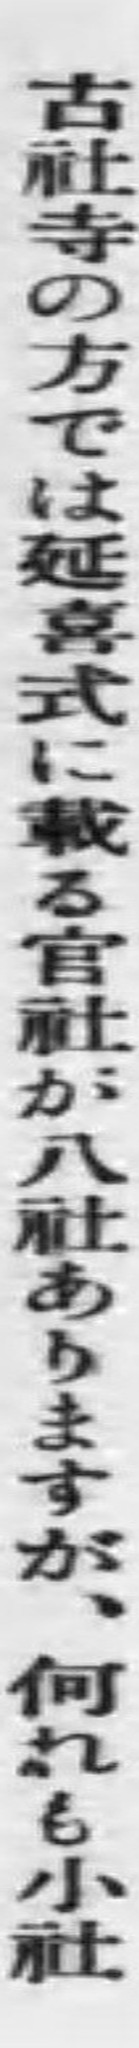古社寺の方では延喜式に載る官社が八社ありますが、何れも小社
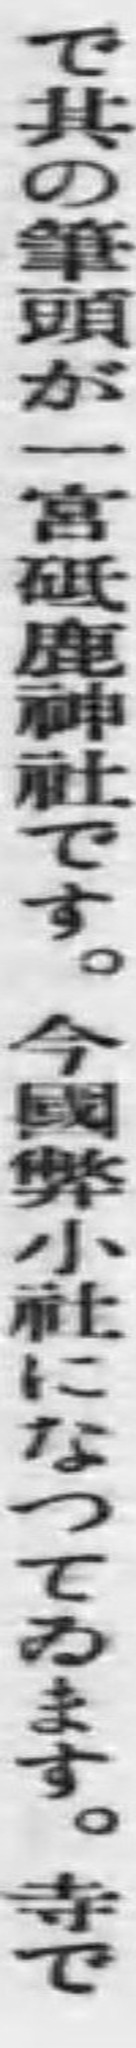で其の筆頭が一宮砥鹿神社です。今国弊小社になつてゐます。寺で
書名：東三河道中記 : 豊橋市及其附近案内
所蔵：国立国会図書館 National Diet Library, JAPAN
